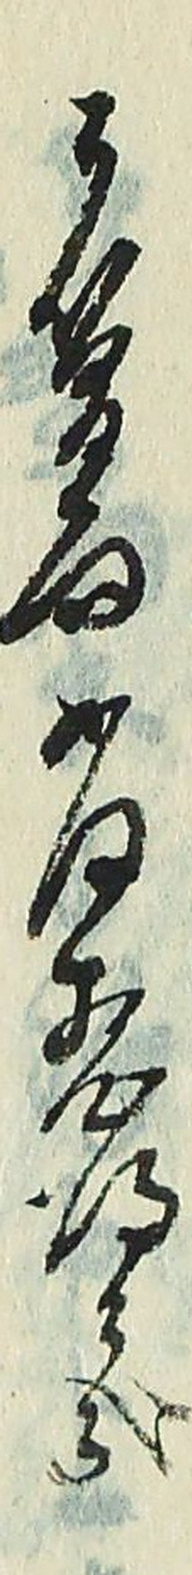了簡向如何相心得候哉
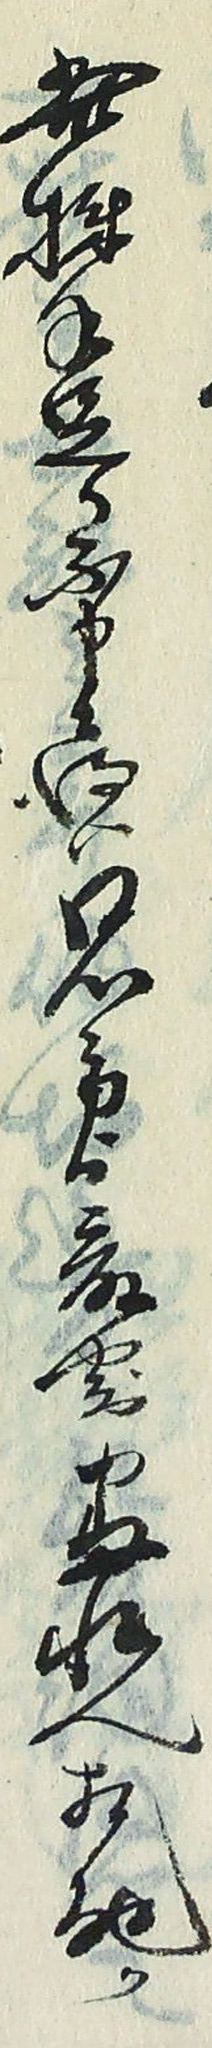此株手足り不申候得ハ同心方ゟ最寄番非人相配り
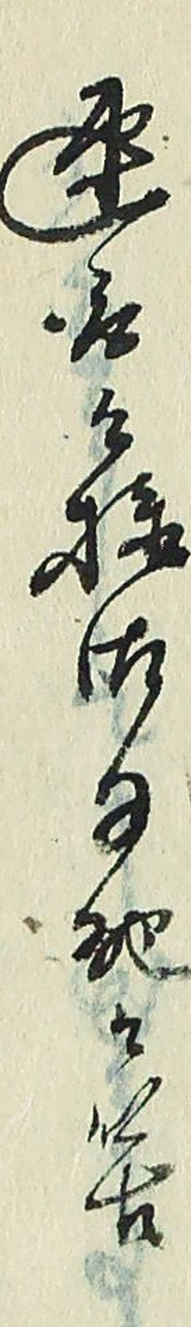速取候様御手配候筈
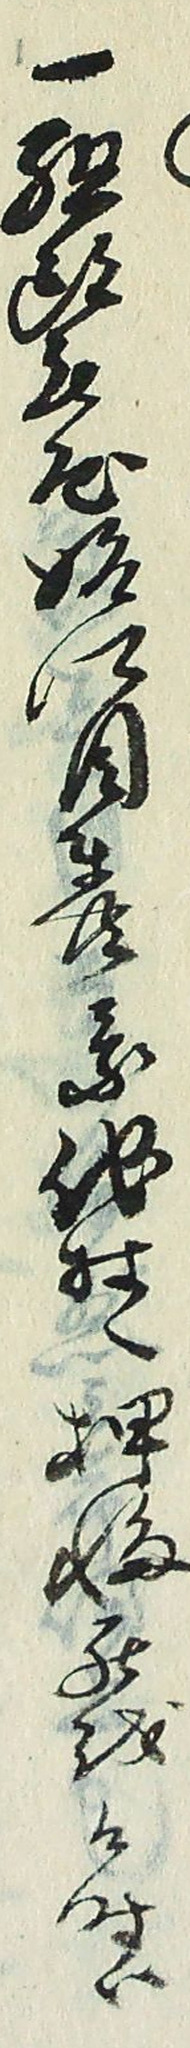一組頭庄屋始郷目付共義他村へ押移罷越候時ハ
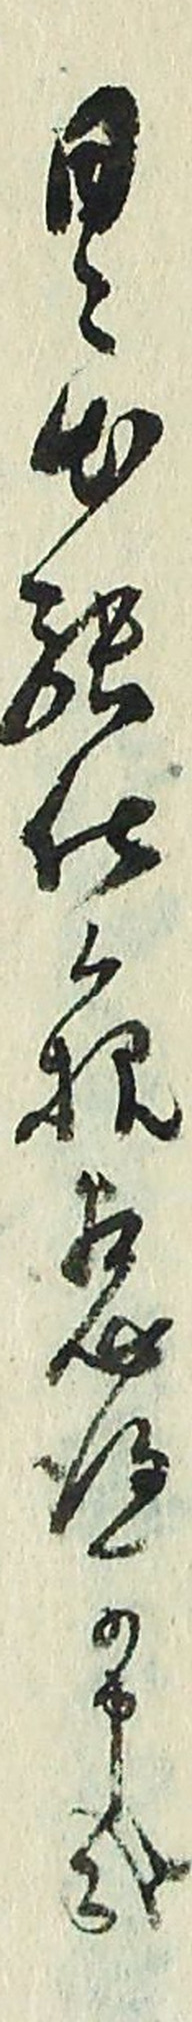日々出張仕候様相心得可申哉
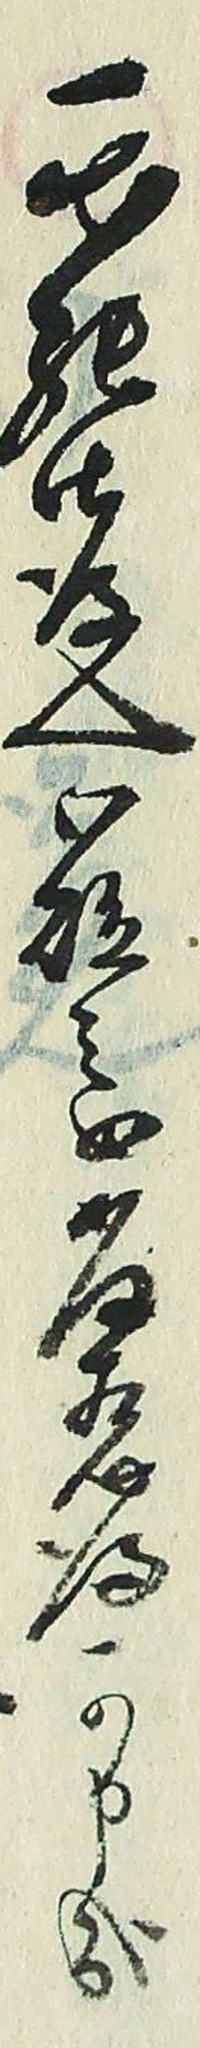一出張御役人御賄之義如何相心得可申哉
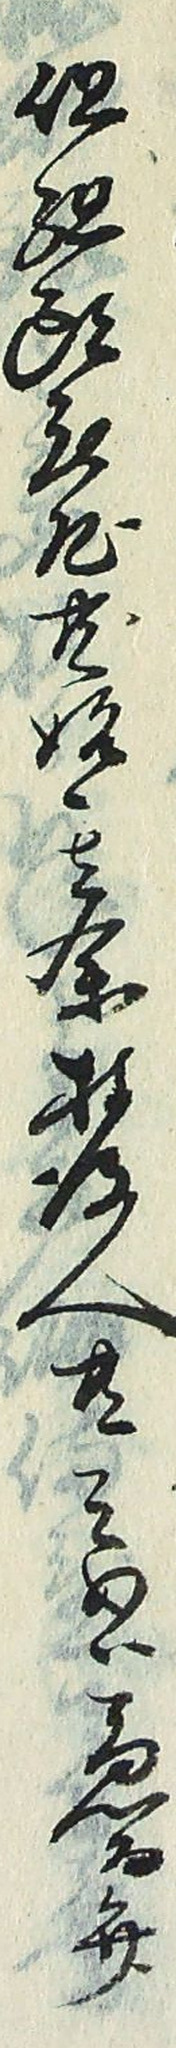但組頭庄屋共始其余村役人共之義ハ兼而弁
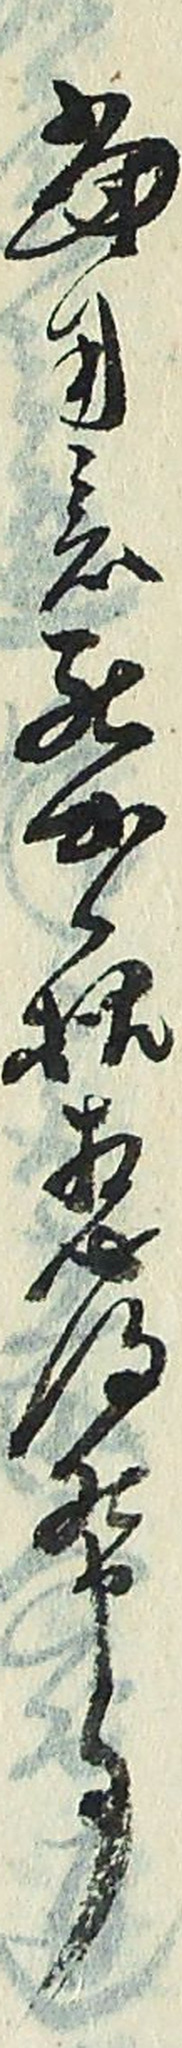當用意罷出候様相心得居申事
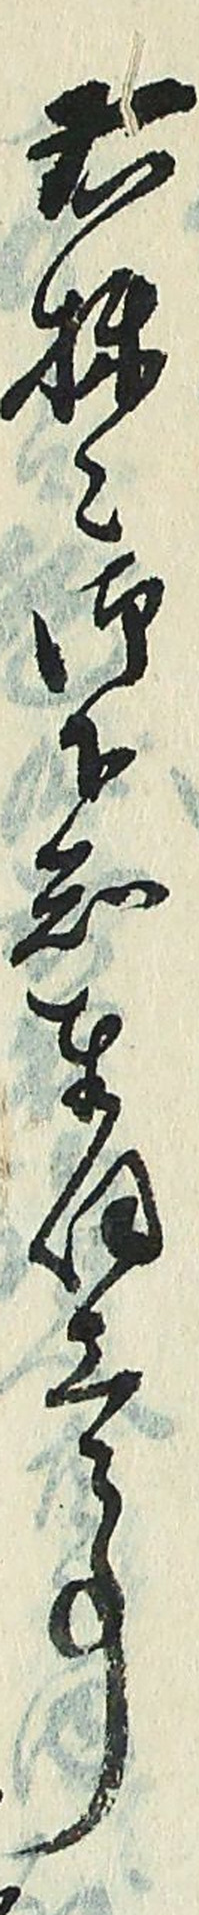右株々御下知奉伺上候事
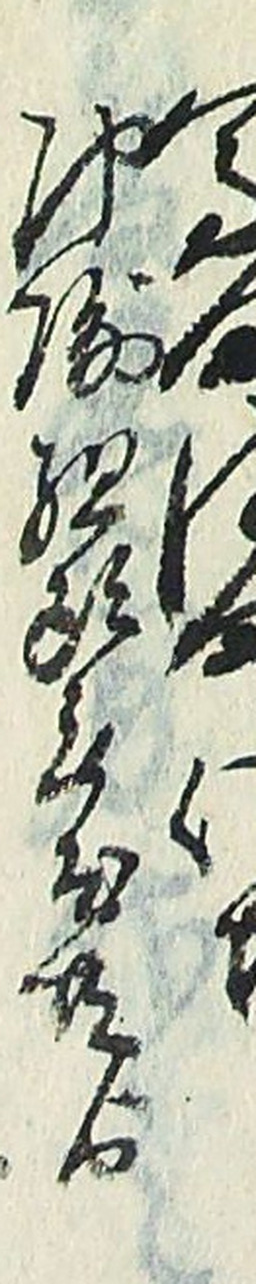沖洲組頭庄屋共ゟ
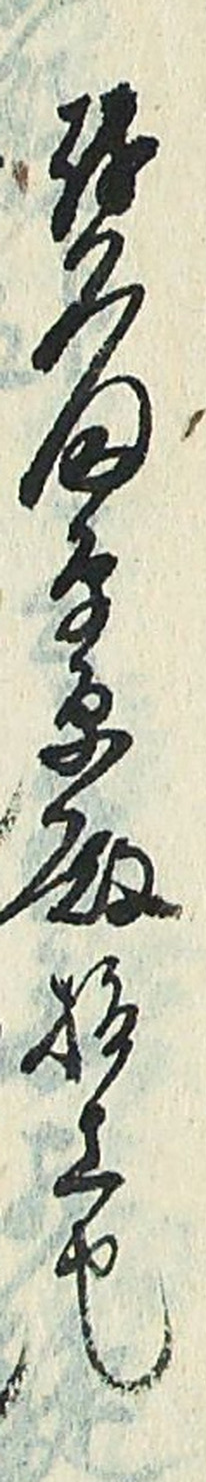越久田平兵衛殿指上申候
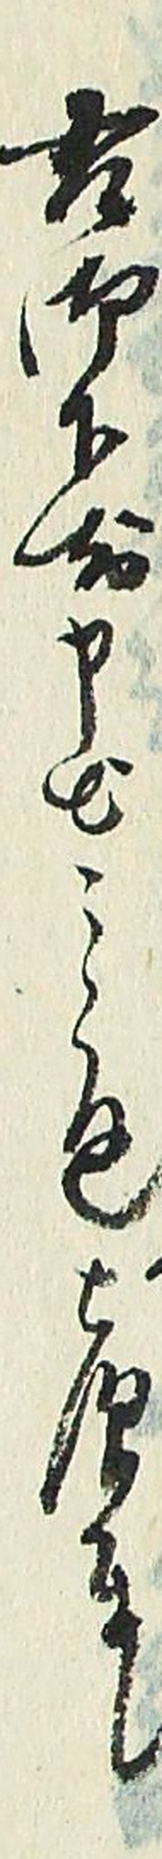右御下知申出之通被仰付候

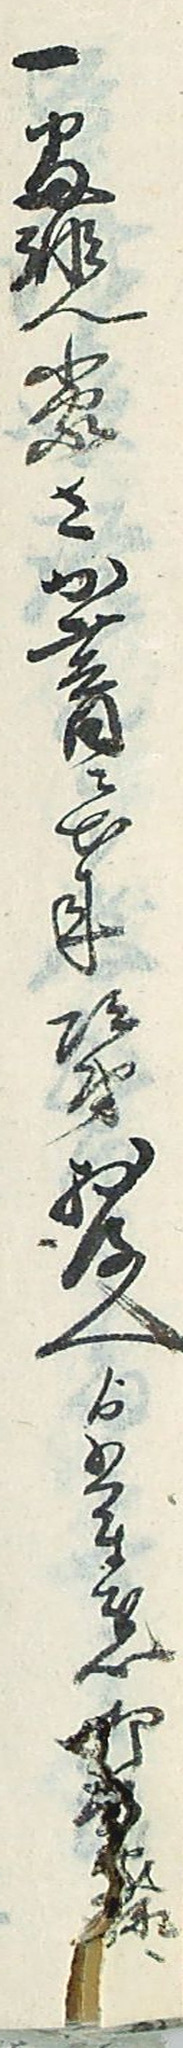一番非人小家さか葺ニ出来次第村役人ゟ書付を以御役處様へ
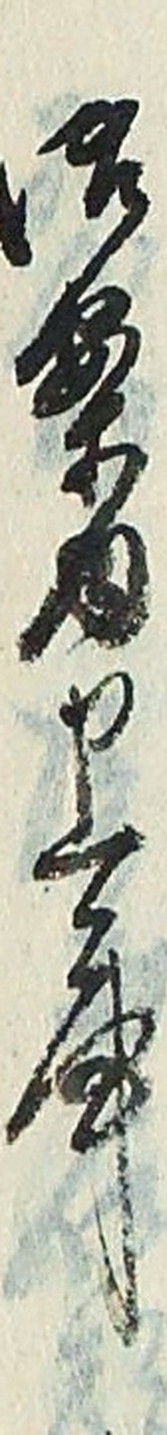御案内申上候事
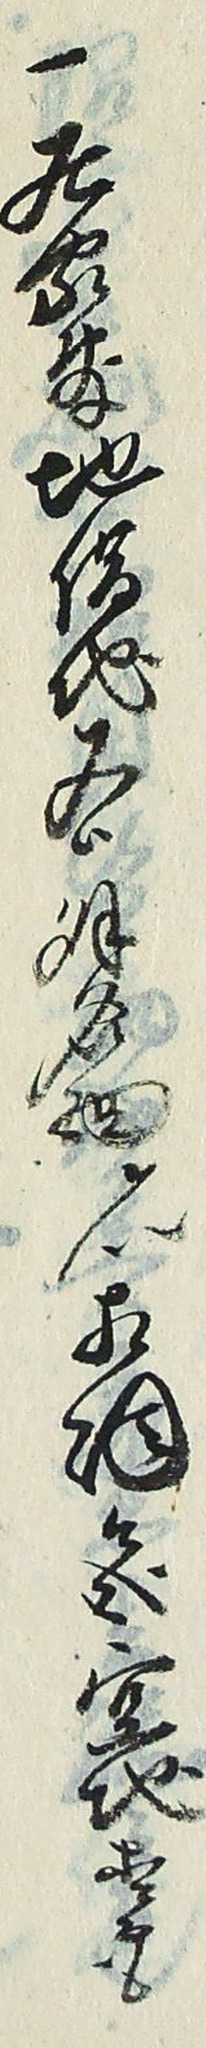一居家敷地借地又ハ外名面ヲ以相調候哉空地等ニ而も
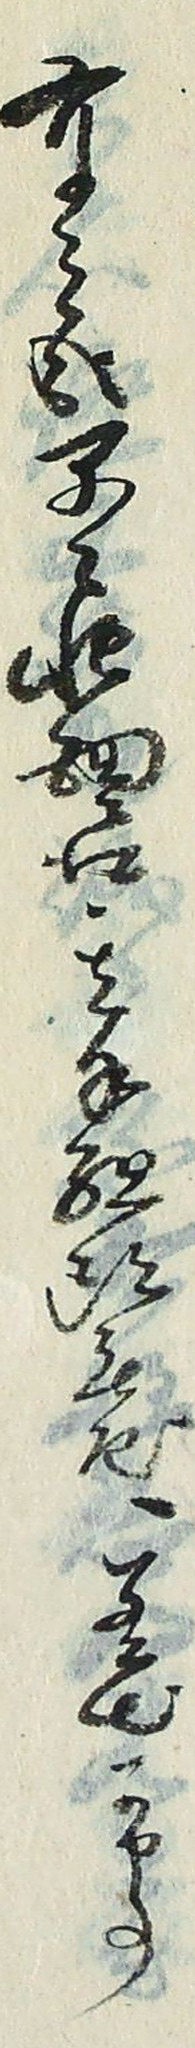有之哉早々帳面ニ仕其手組頭庄屋へ差出可申事
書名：諸御趣意書并御下知向之写
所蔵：鳴門教育大学 Naruto University of Education
